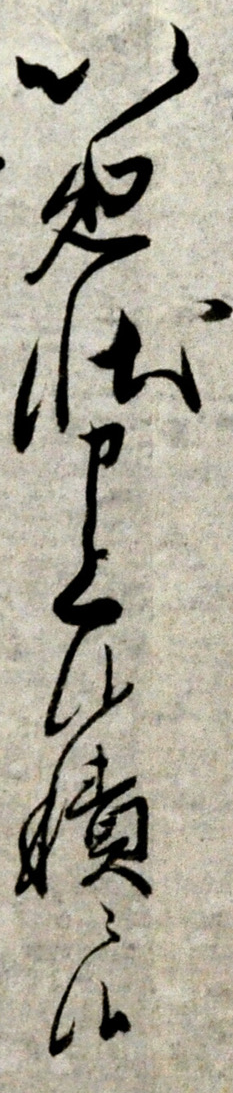以廻状申上候積に候

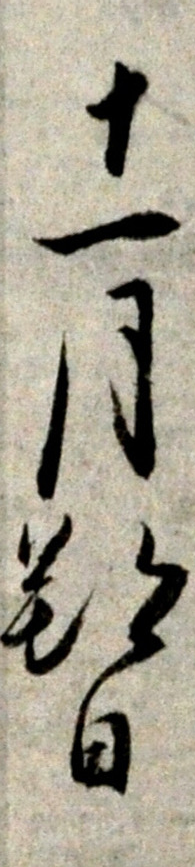十一月朔日

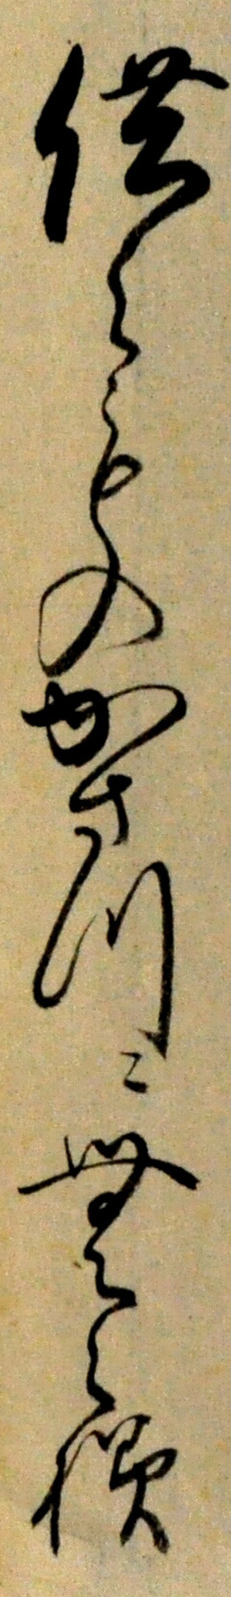供之ものかさつに無之様
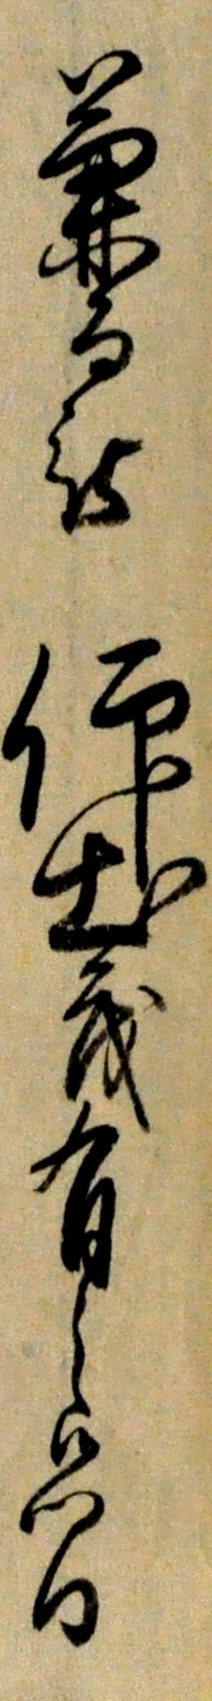兼て被仰出も有之候間
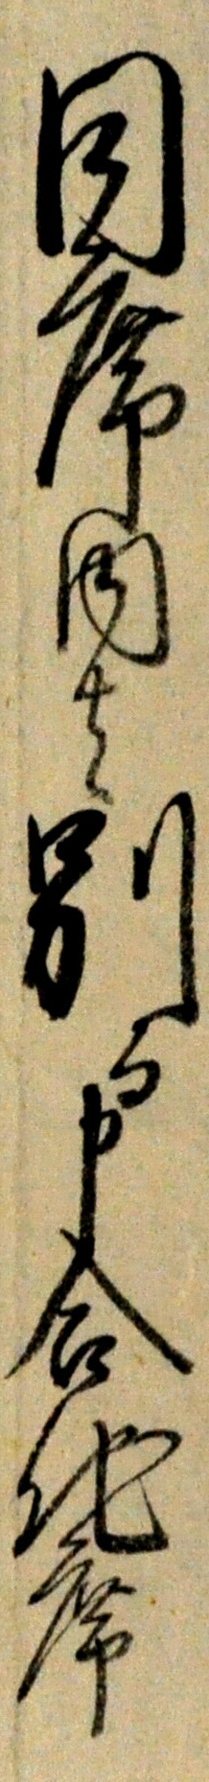同席内は別て申合他席
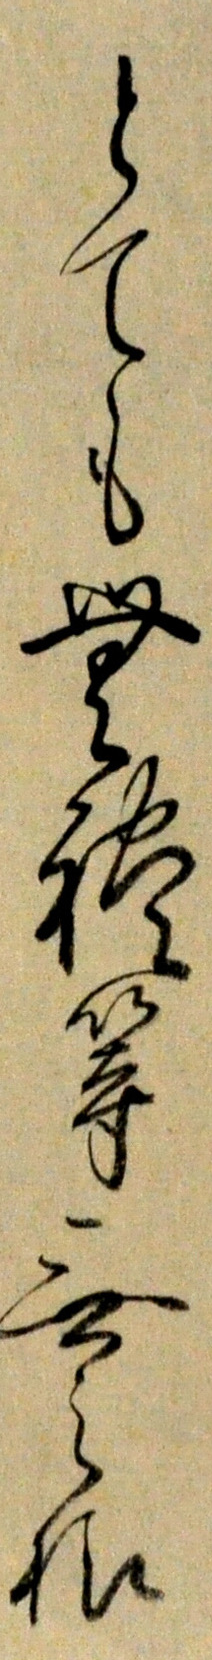とても無礼等無之様
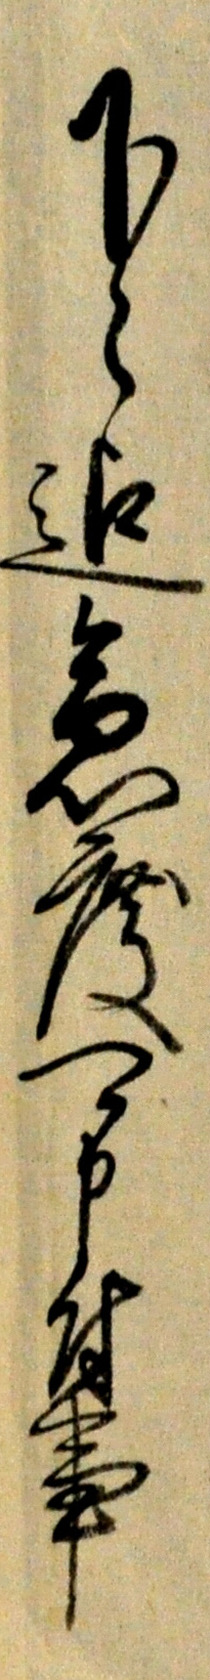下々迄急度可申付事
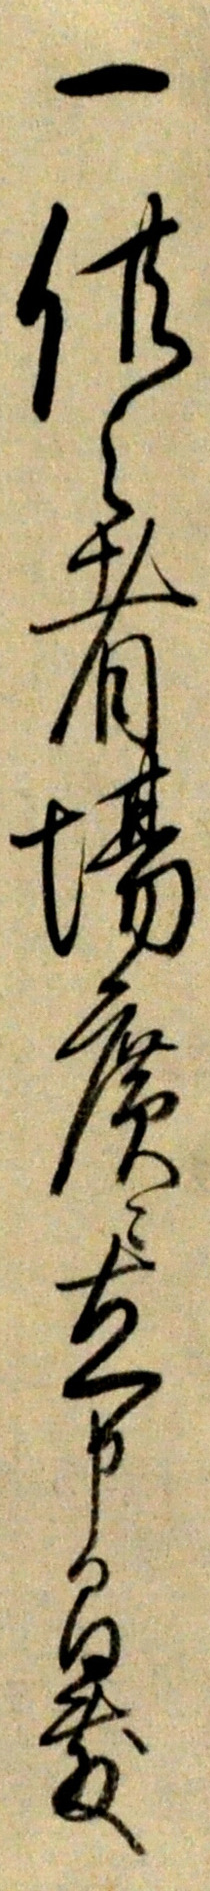一供之者場広に立申間敷
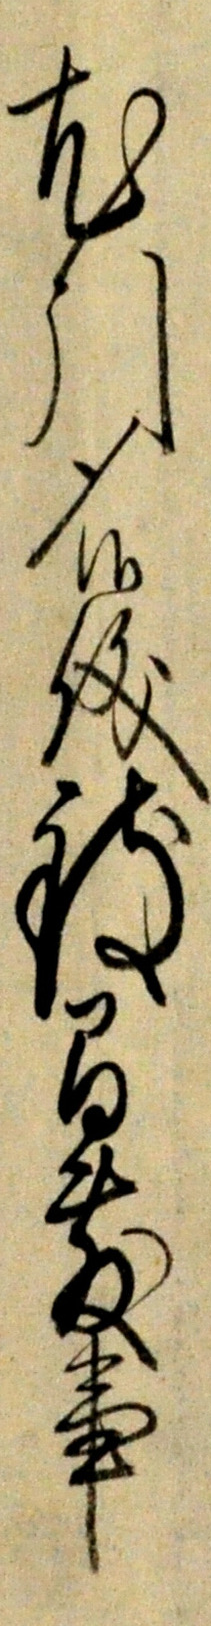尤引〆候儀致間敷事
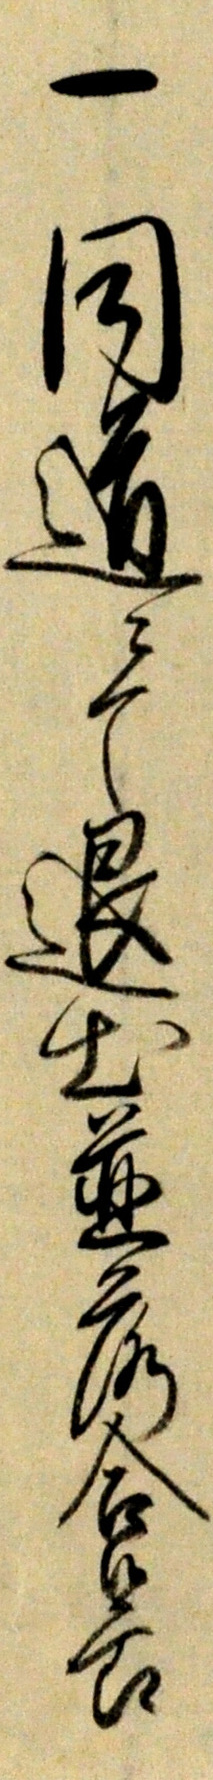一同道にて退出並落合候節
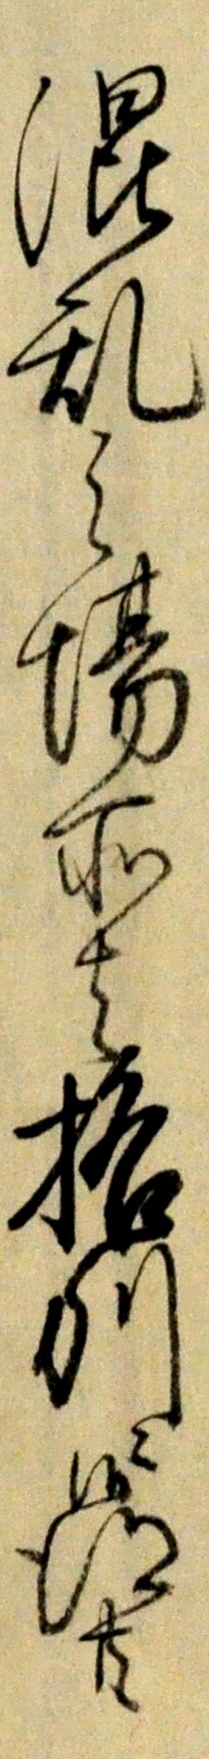混乱之場所は格別に候得共
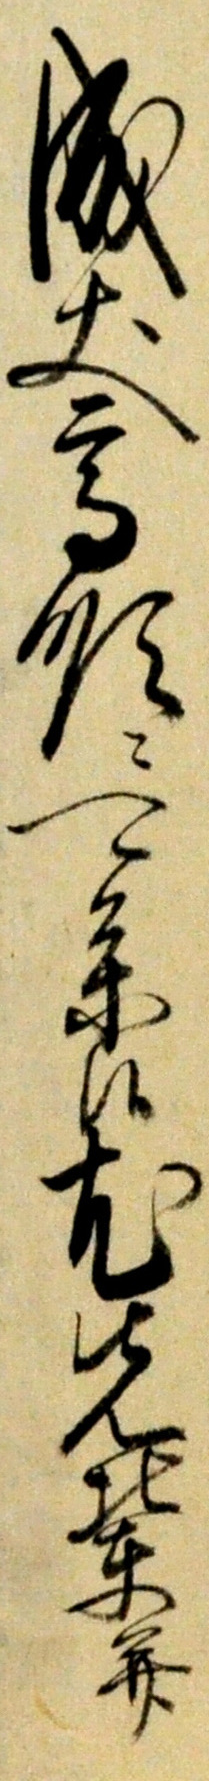成丈高順に可参候尤先輩并
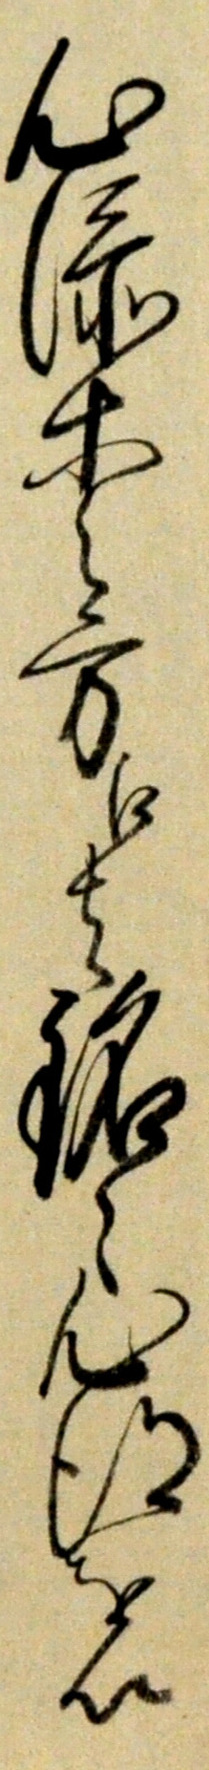心添等之方えは銘々心得を以
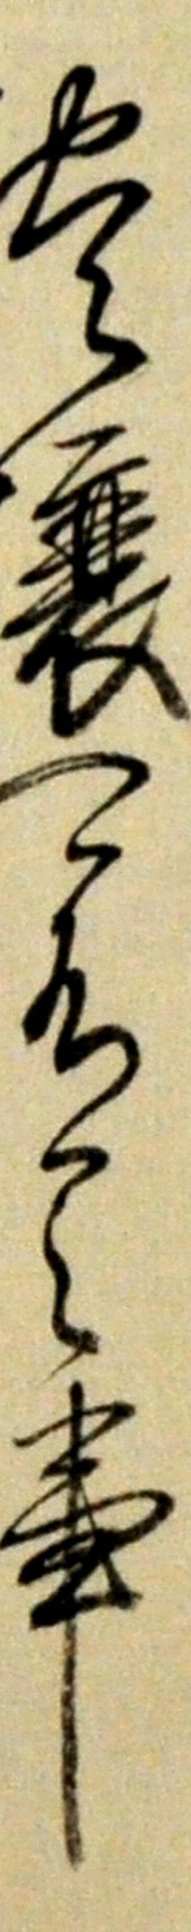礼譲可有之事

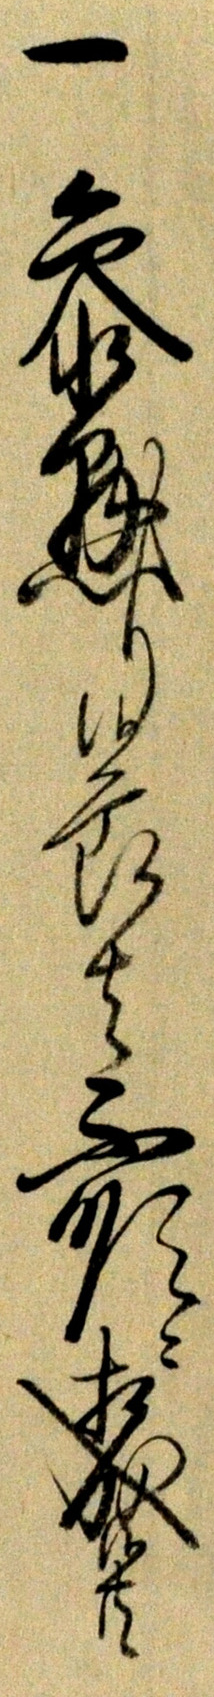一参懸り候節は不順に相成候共
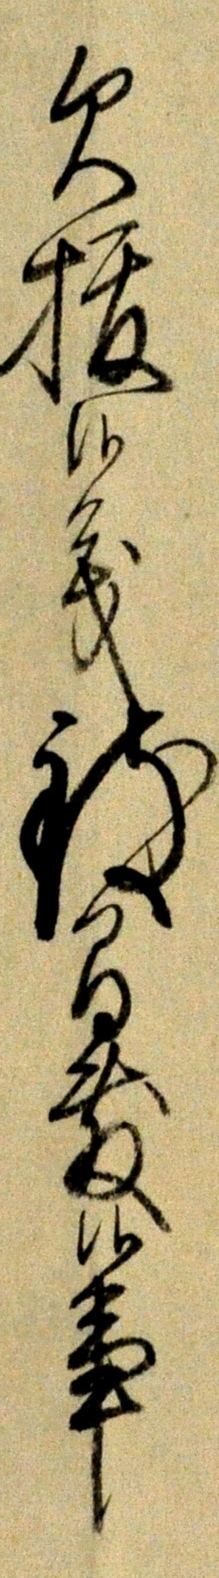欠抜候義致間敷候事
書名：申合帳〔一括〕
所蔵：伊那市立高遠町図書館・合同会社AMANE
